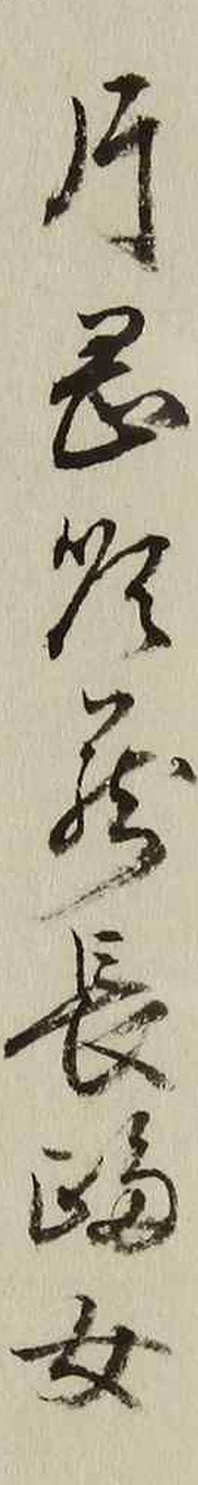片岡順蔵長跢女
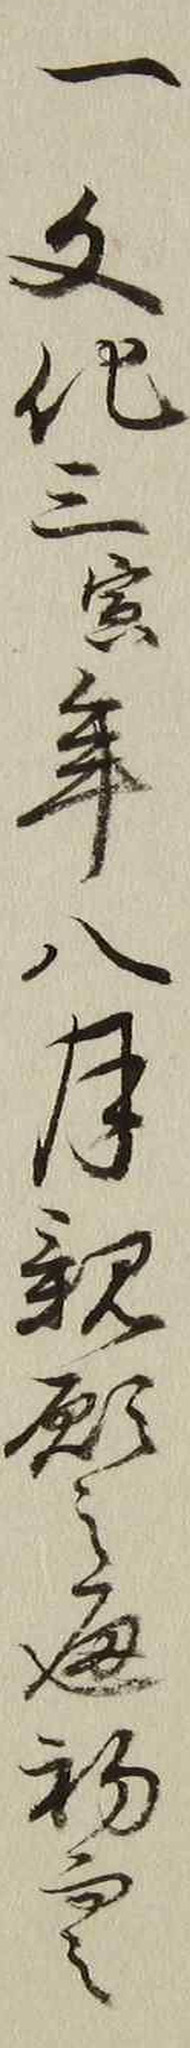一文化三寅年八月親願之通初而之
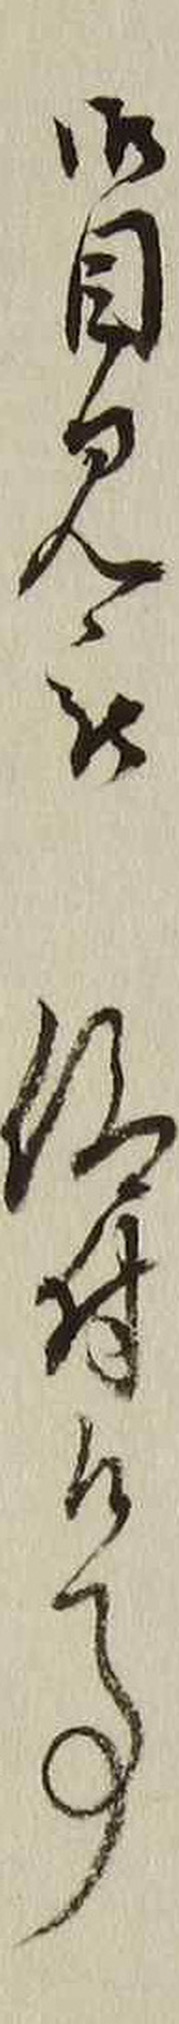御目見被仰付候事
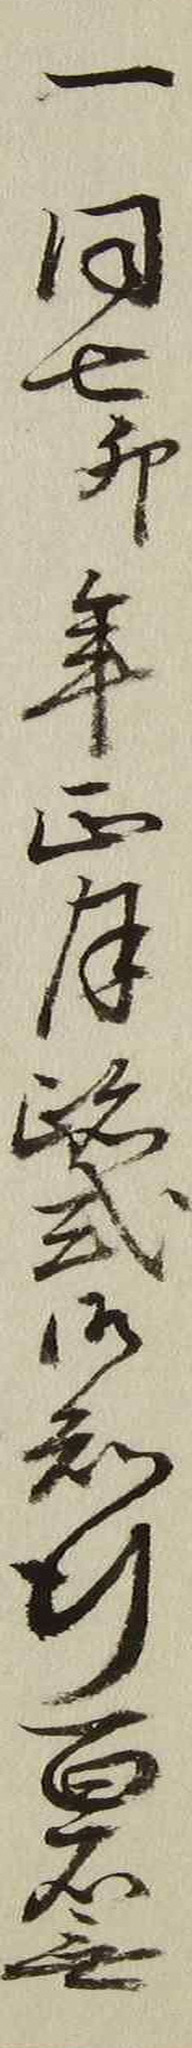一同七卯年正月跡式御知行百石無
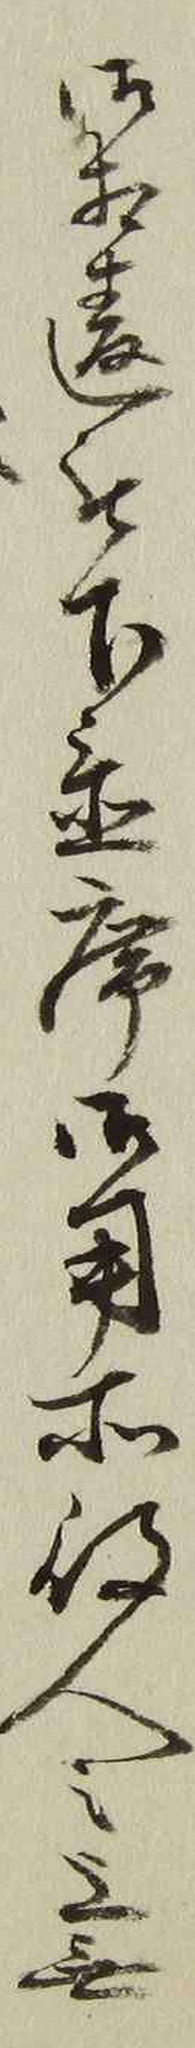御相違被下置席御用所役人之上無
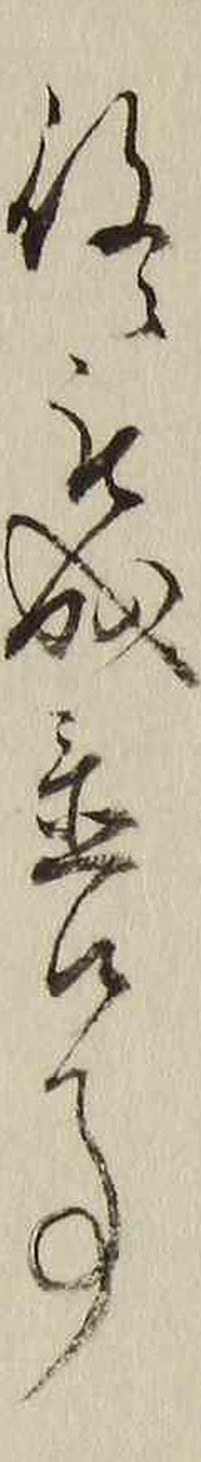役ニ被成置候事
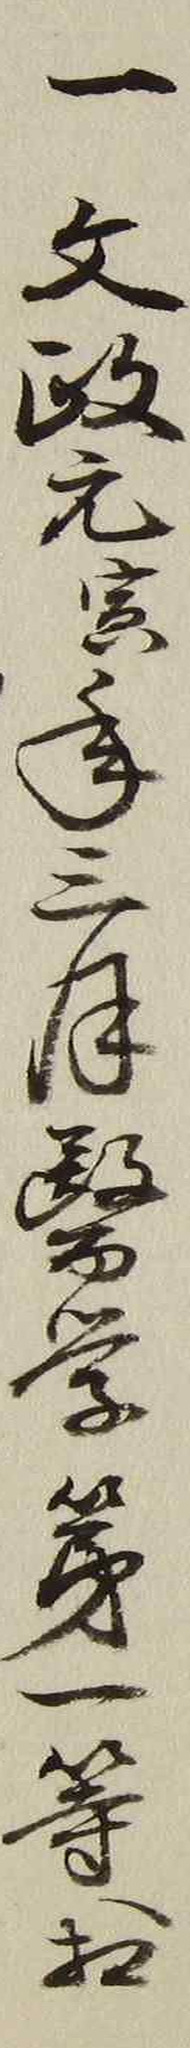一文政元寅年三月医学第一等へ相
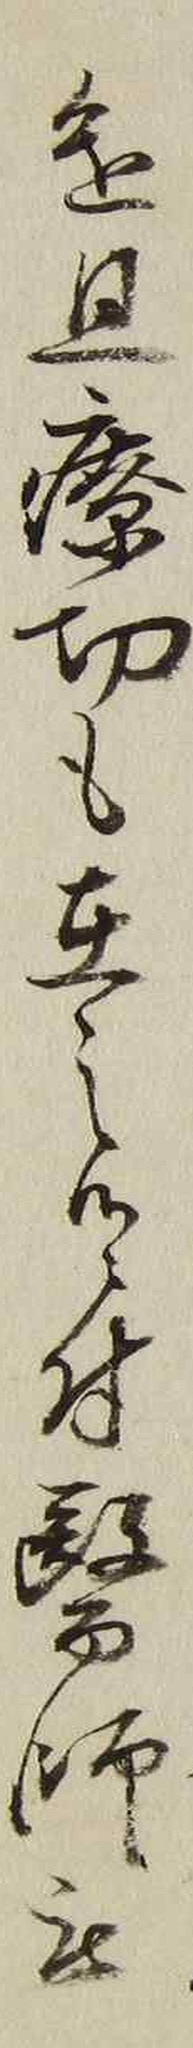進且療功も在之候ニ付医師被
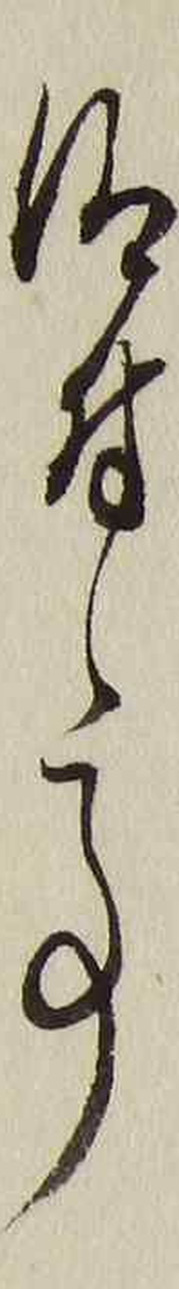仰付候事

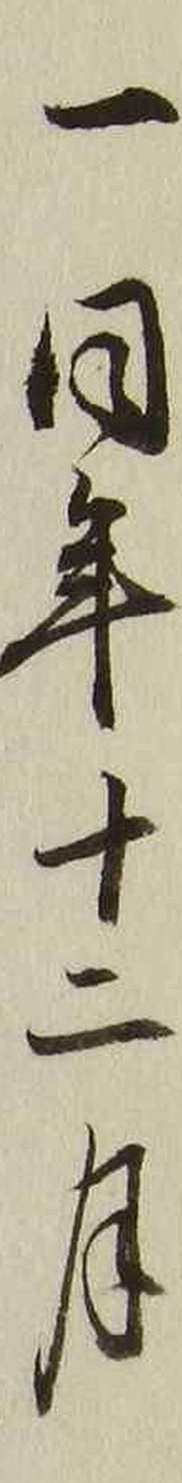一同年十二月
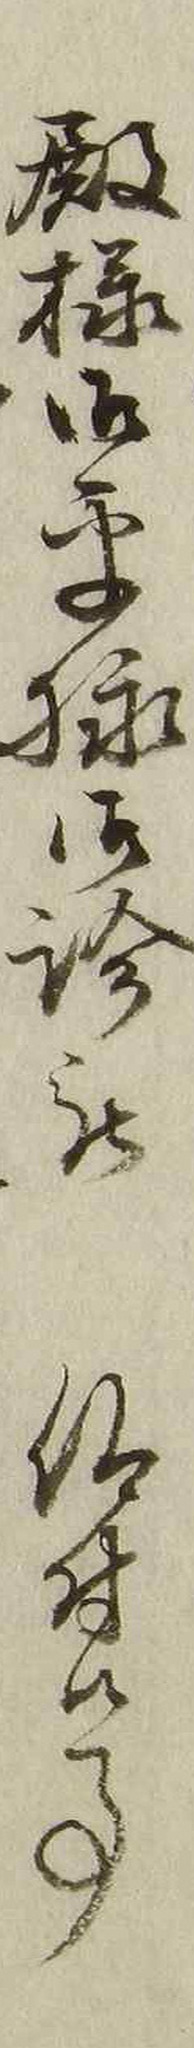殿様御平脈御診被仰付候事
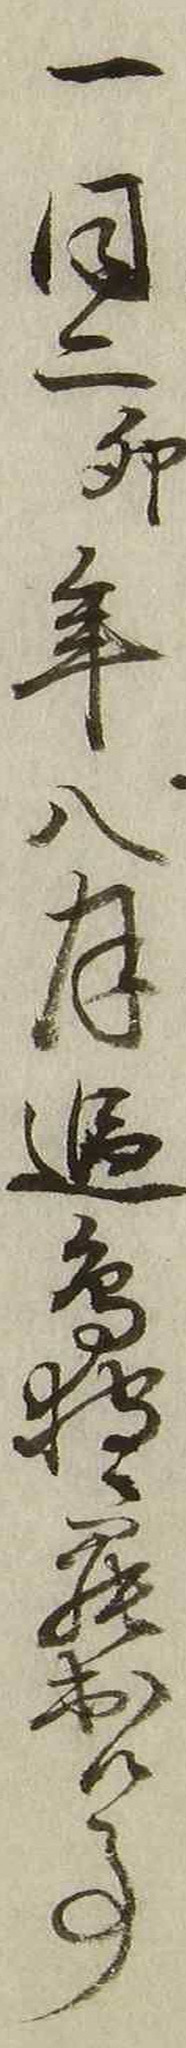一同二卯年八月追鳥狩へ罷出候事
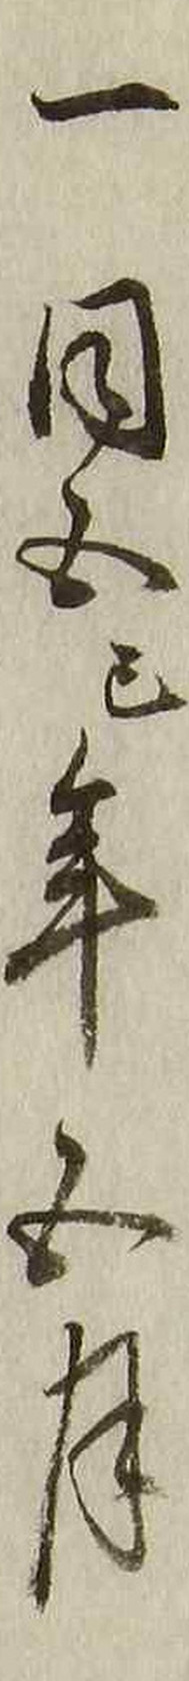一同五巳年五月
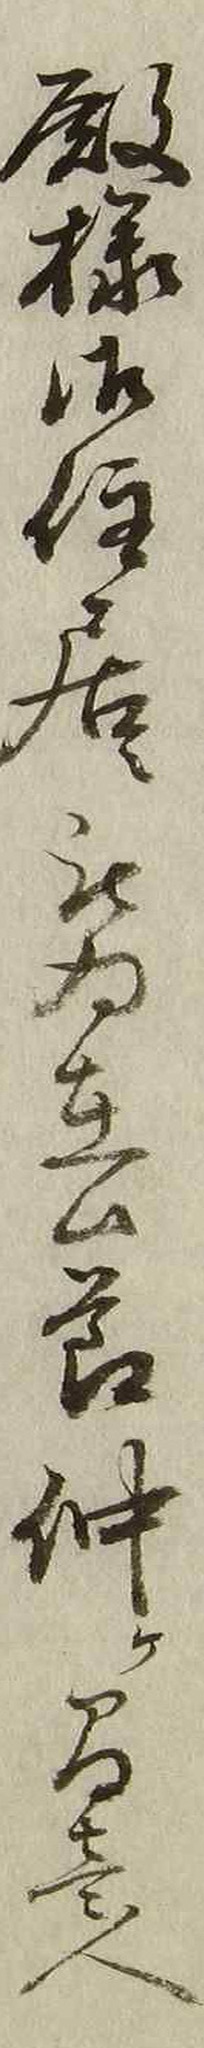殿様御住居ニ被為在候節仲ヶ間壱人
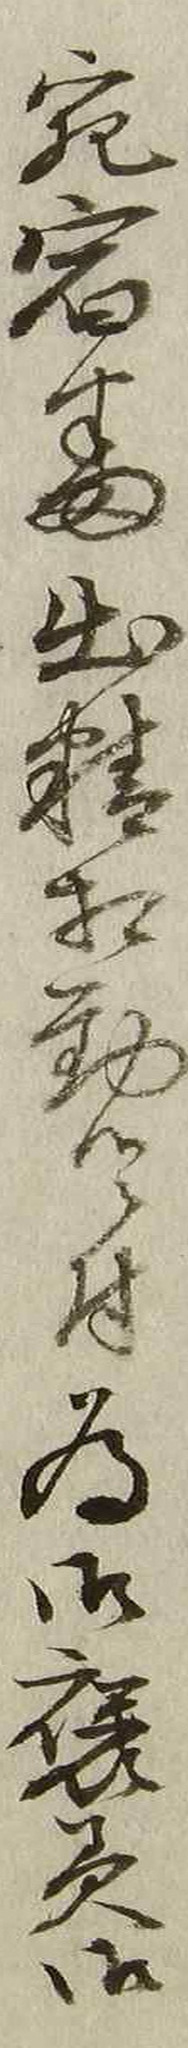宛宿番出精相勤候ニ付為御褒美御
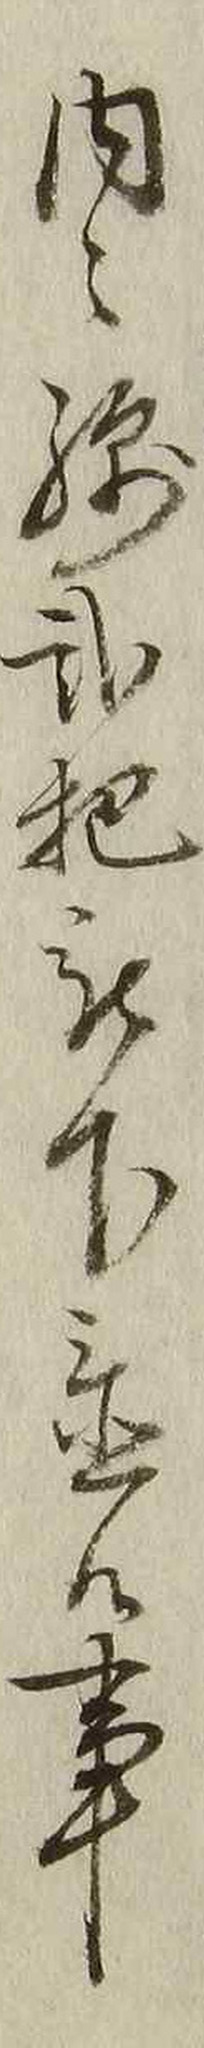内々綿弐把被下置候事
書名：諸士系譜　巻之39　は之部7
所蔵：会津若松市立会津図書館
